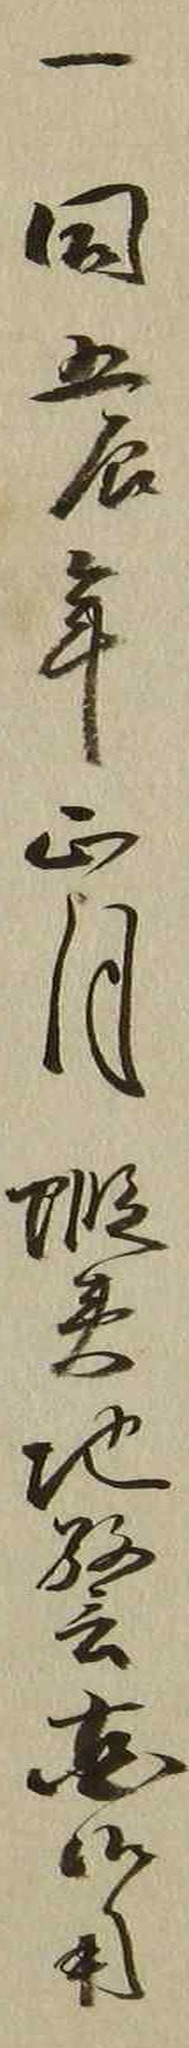一同五辰年正月蝦夷地警固御用
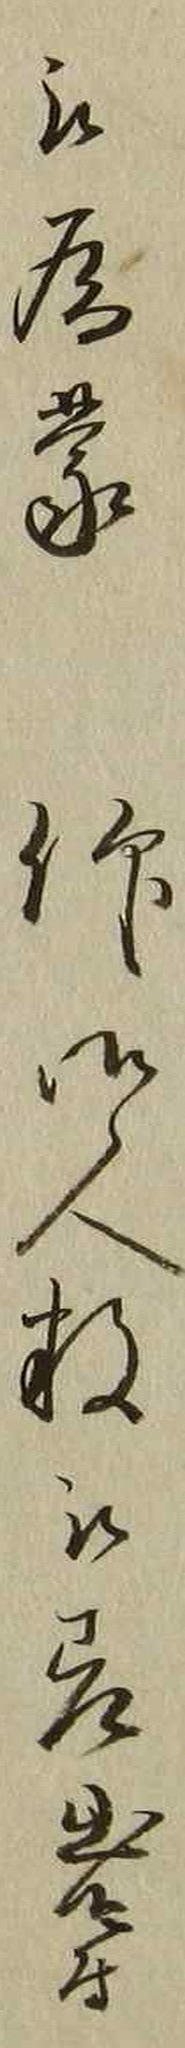被為蒙仰御人数被差出候ニ付
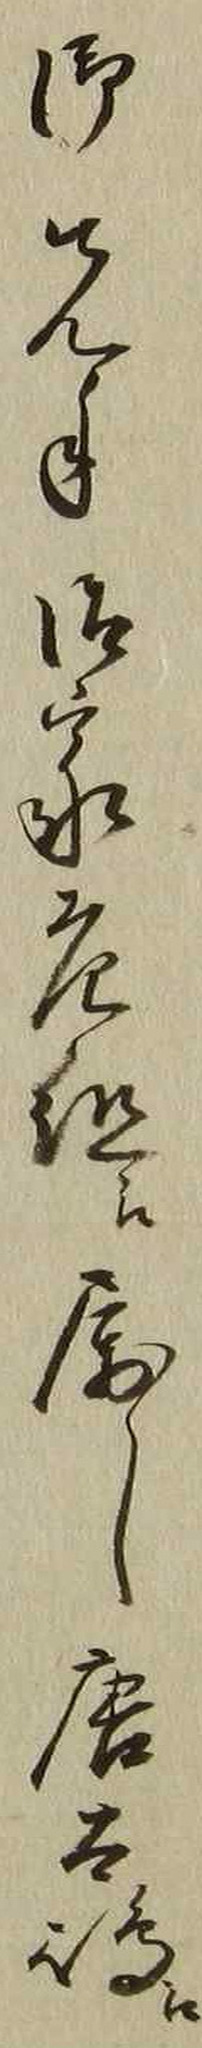御先手御家老組江属し唐太嶋江
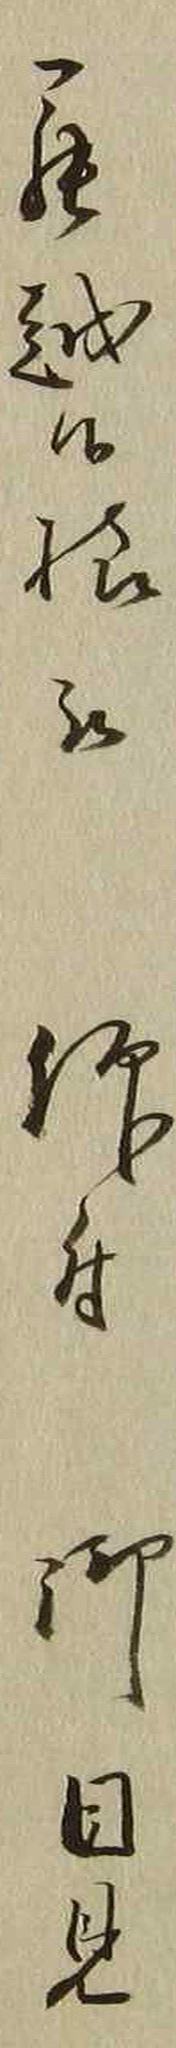罷越候様被仰付御目見
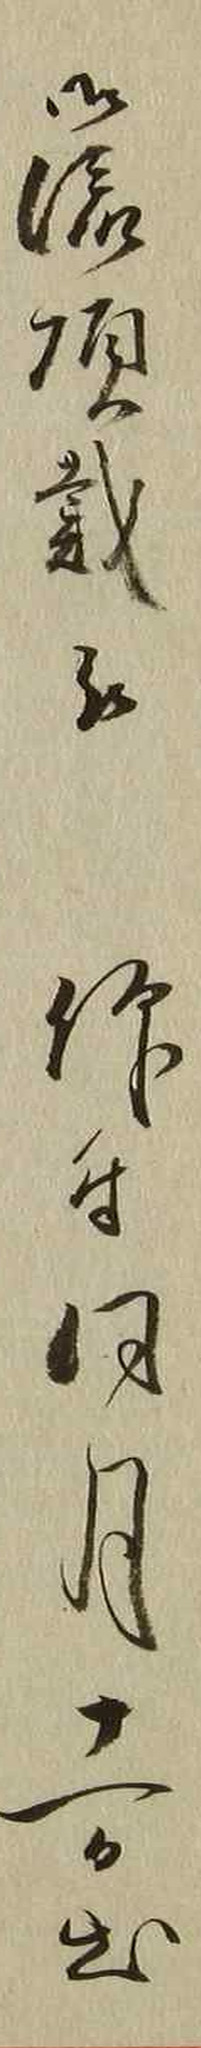御流頂戴被仰付同月十一日出
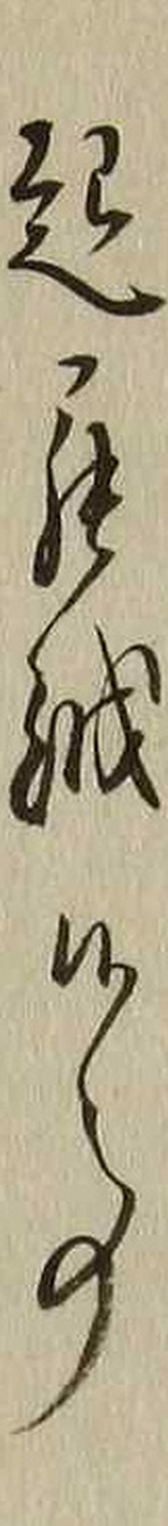起罷越候事
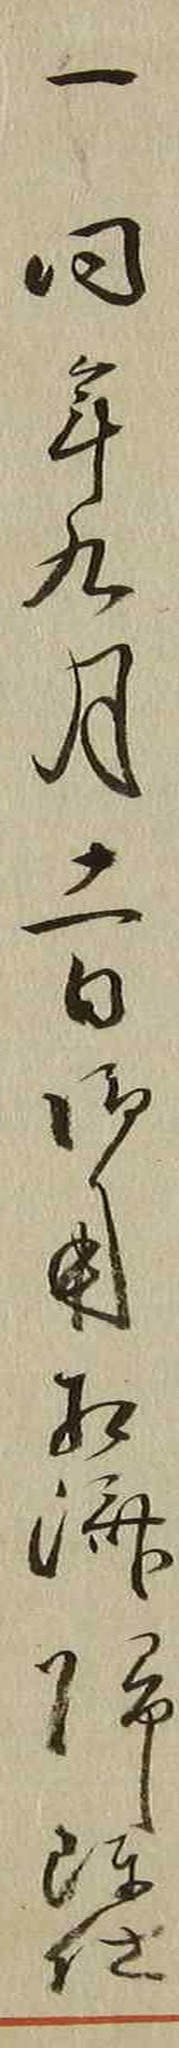一同年九月十一日御用相済帰陣仕
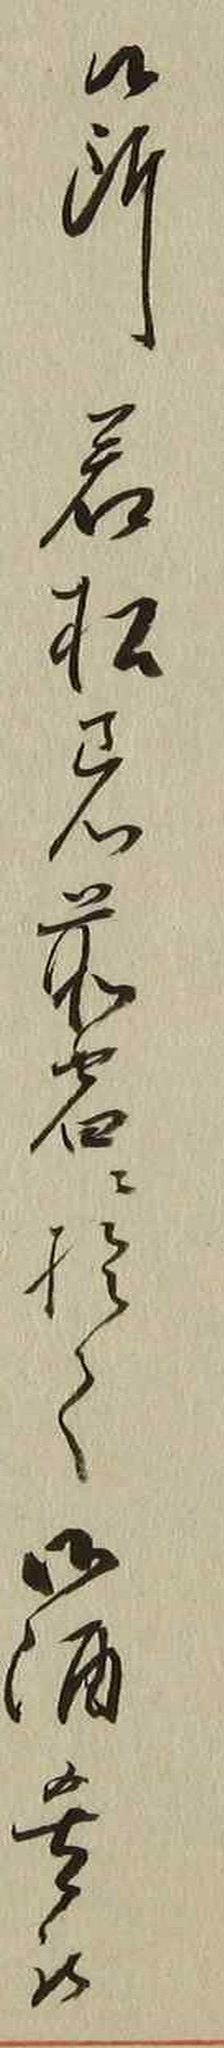候所若松着前宿ニ於て御酒肴被
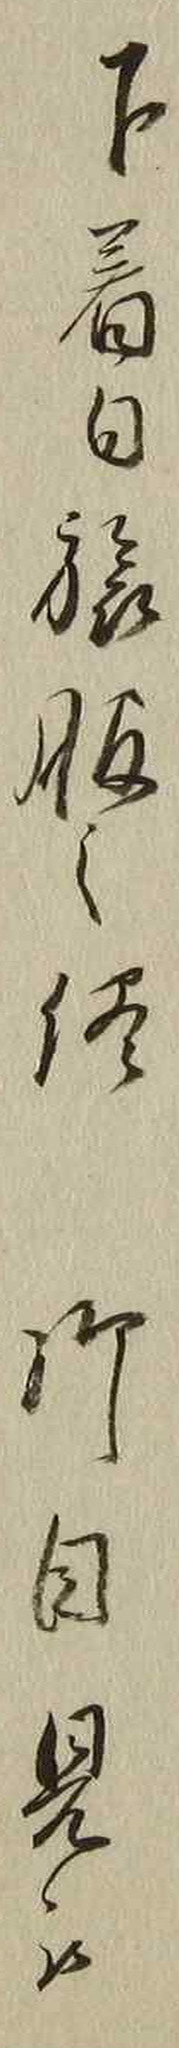下着日旅服之儘御目見被
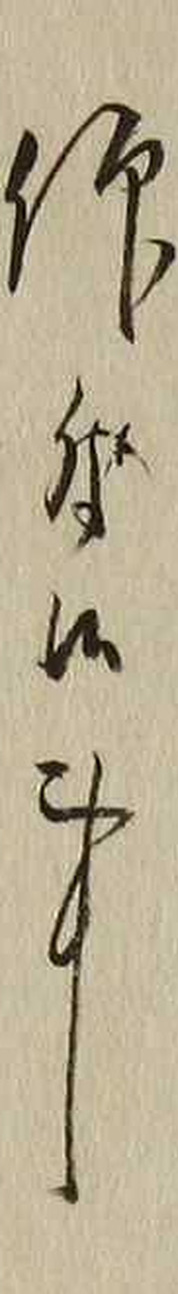仰付候事
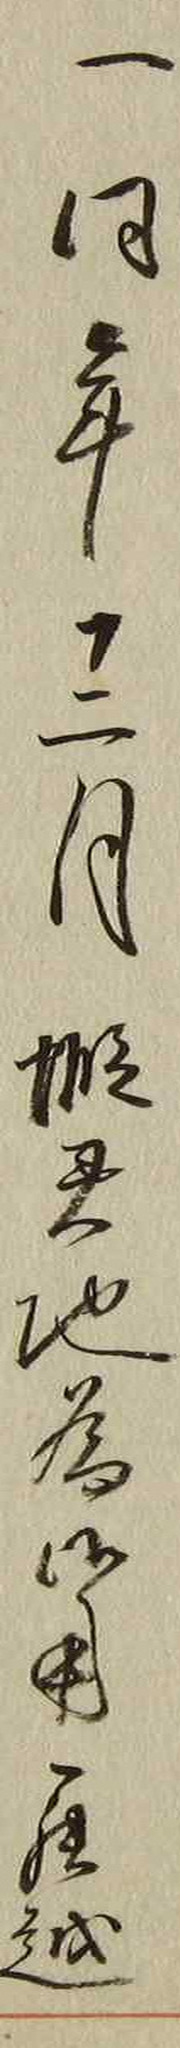一同年十二月蝦夷地為御用罷越
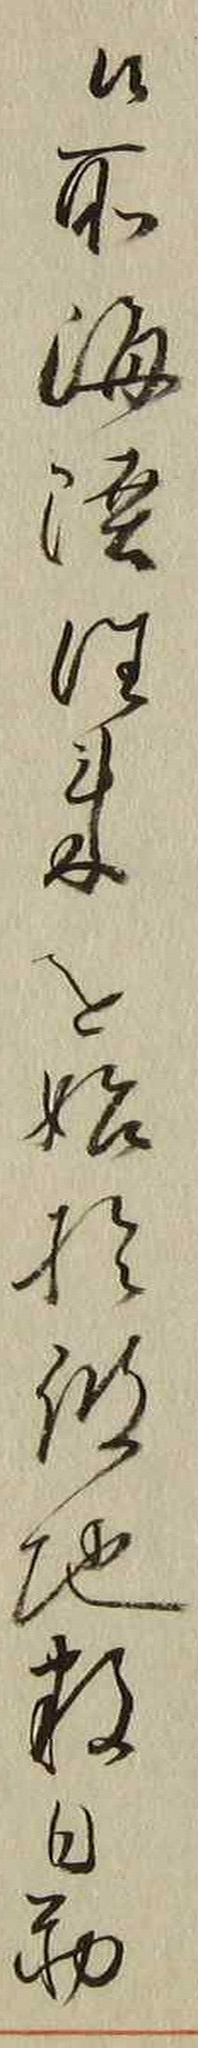候所海陸往来を始於彼地数日勤
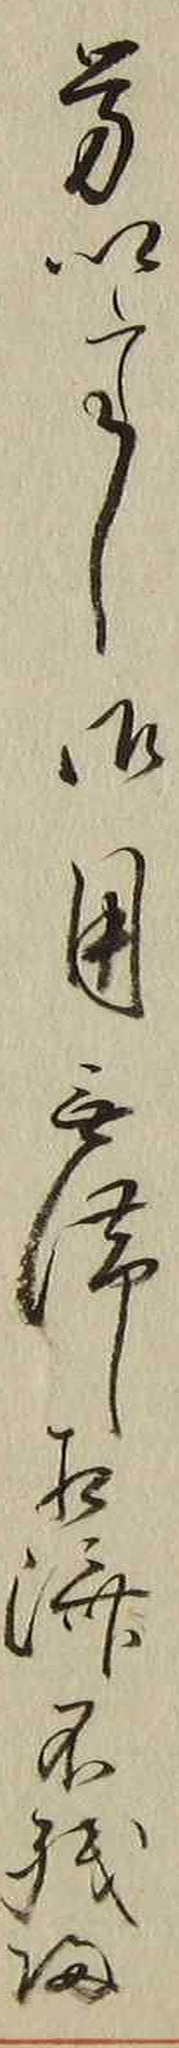労以たし御用無滞相済不残帰
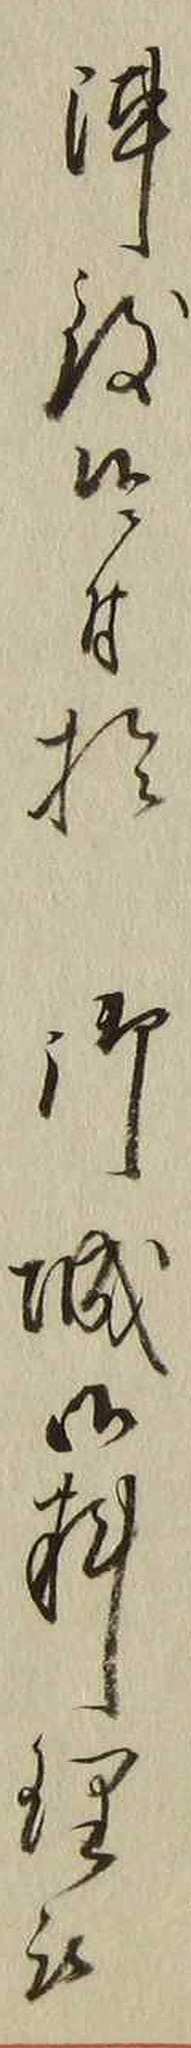陣致候ニ付於御城御料理被
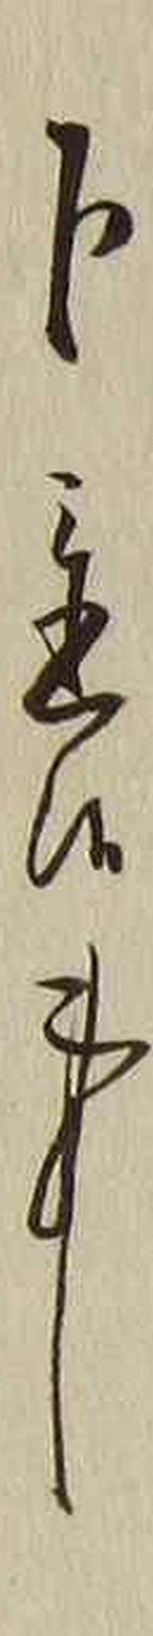下置候事
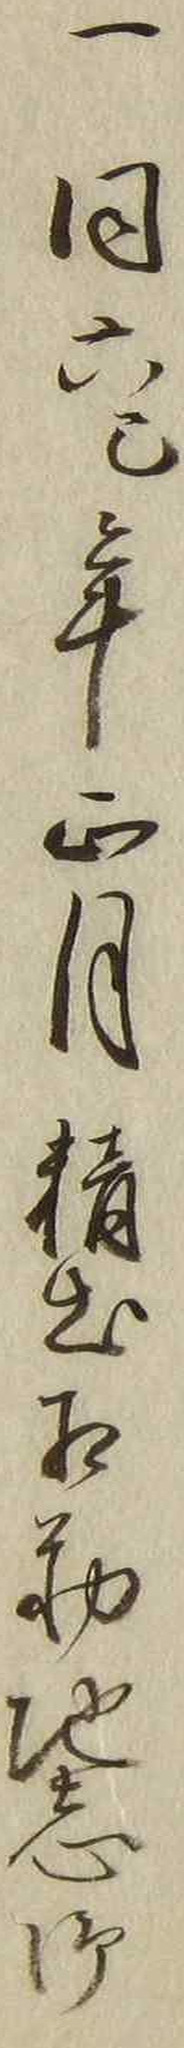一同六巳年正月精出相勤地志御
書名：諸士系譜　巻之68　を之部2
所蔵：会津若松市立会津図書館
